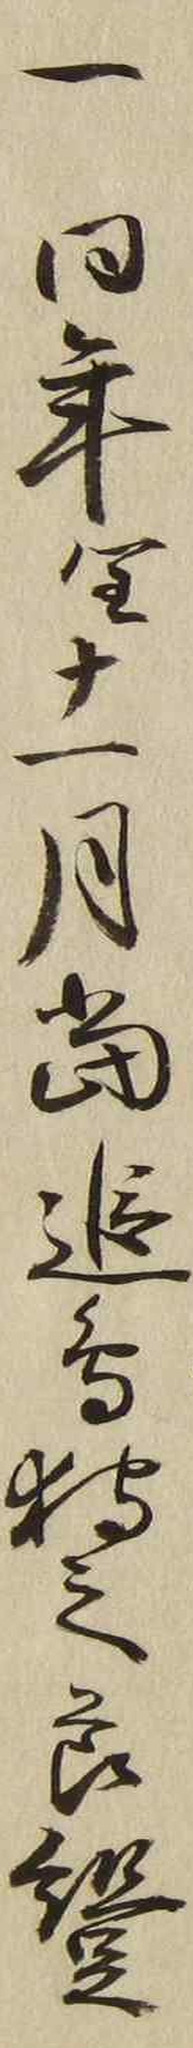一同年閏十一月当追鳥狩之節組足

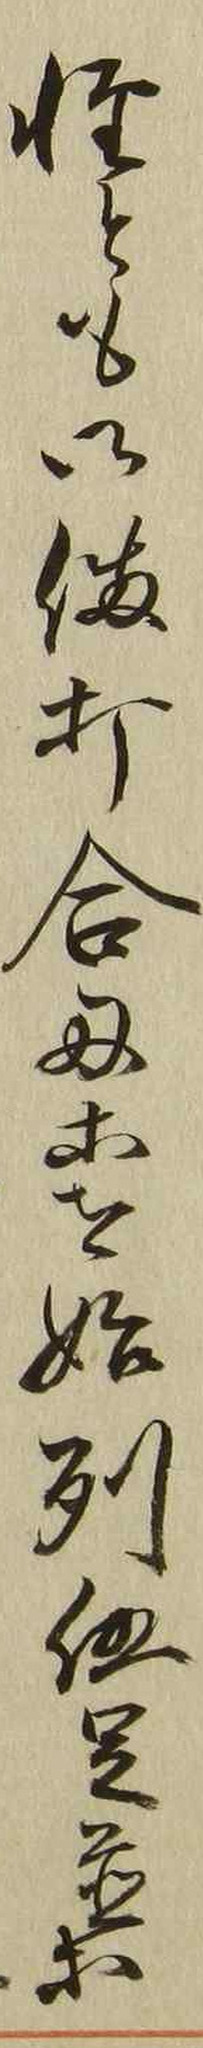軽とも御備打合刃等を始列伍足並等
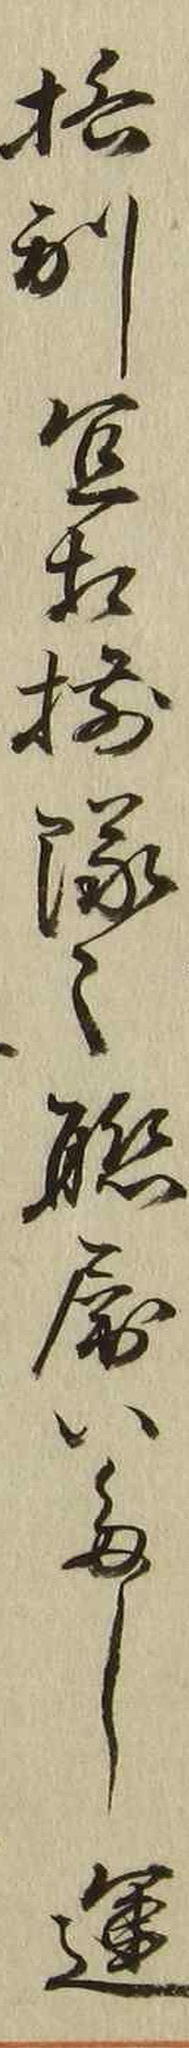格別宜相揃隊々聯属いたし運
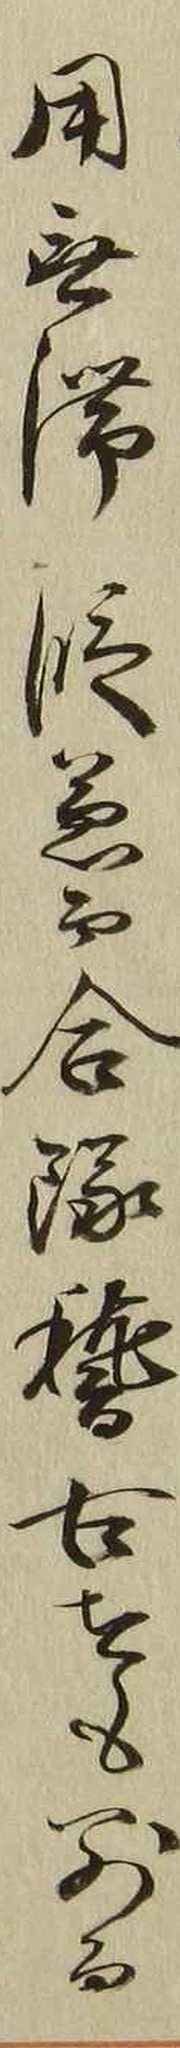用無滞段兼而合隊稽古をも別而
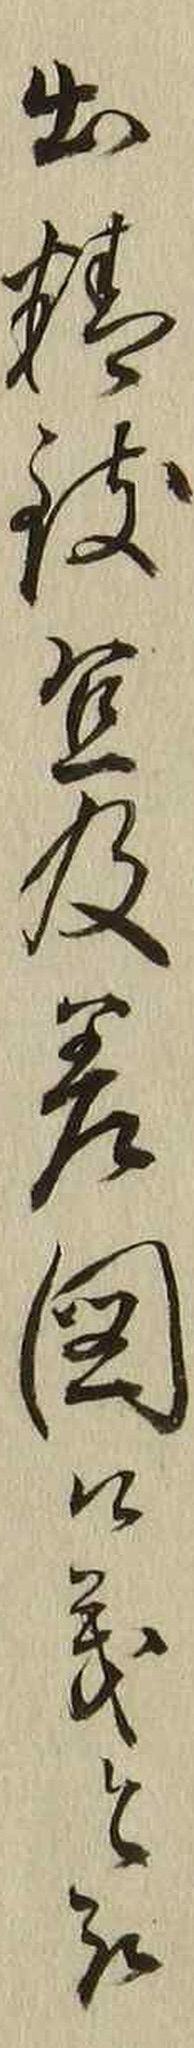出精致宜及差図候義と被
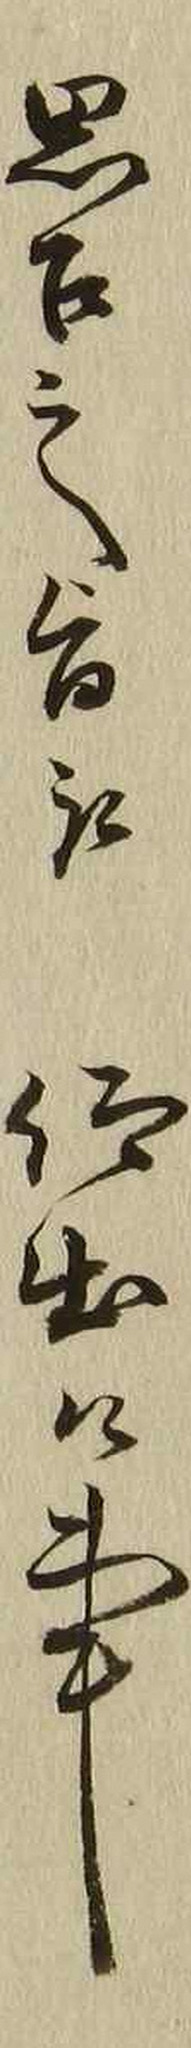思召之旨被仰出候事
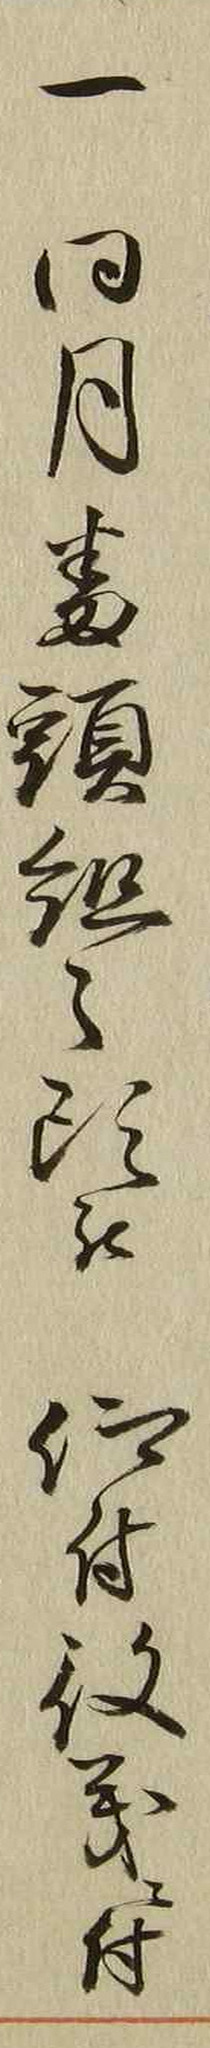一同月番頭組之頭被仰付役義ニ付
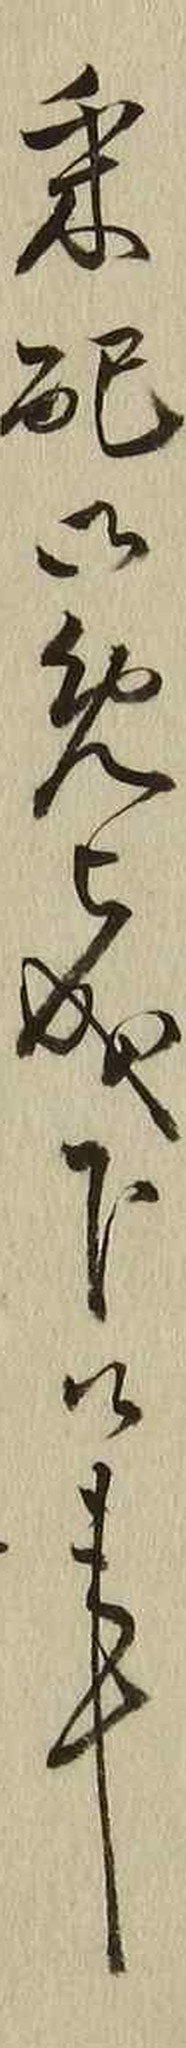采配御免被成下候事
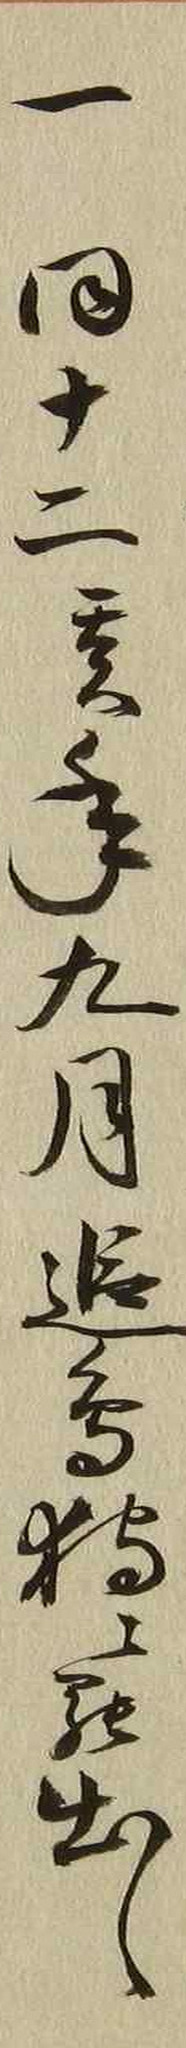一同十二亥年九月追鳥狩ニ罷出候
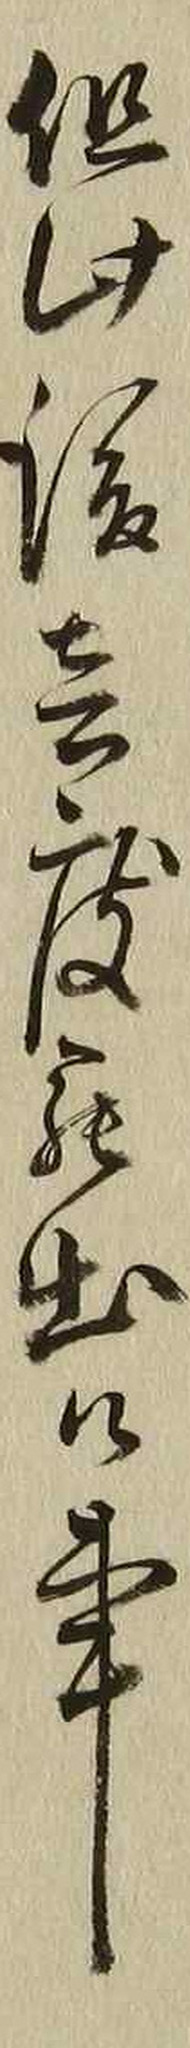但此後壱度罷出候事
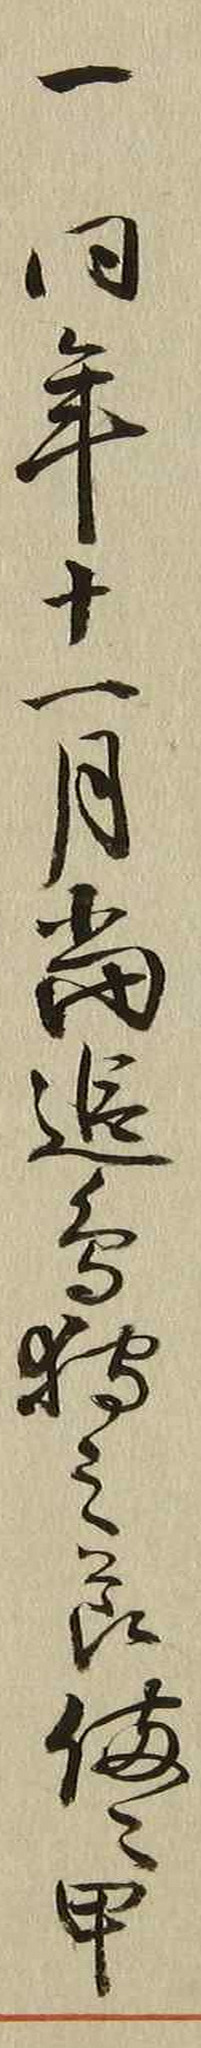一同年十一月当追鳥狩之節備ニ甲
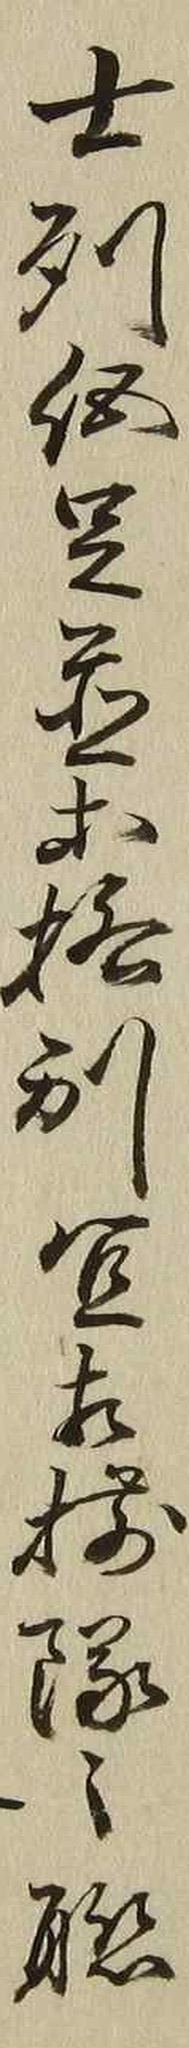士列伍足並等格別宜相揃隊々聯
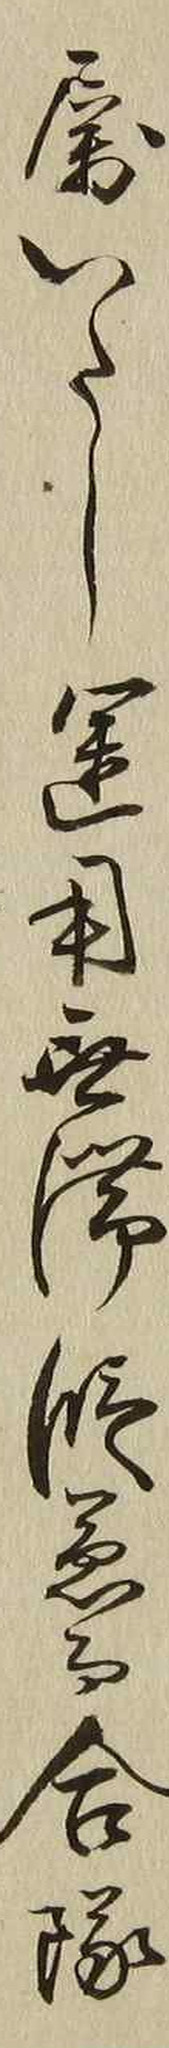属いたし運用無滞段兼而合隊
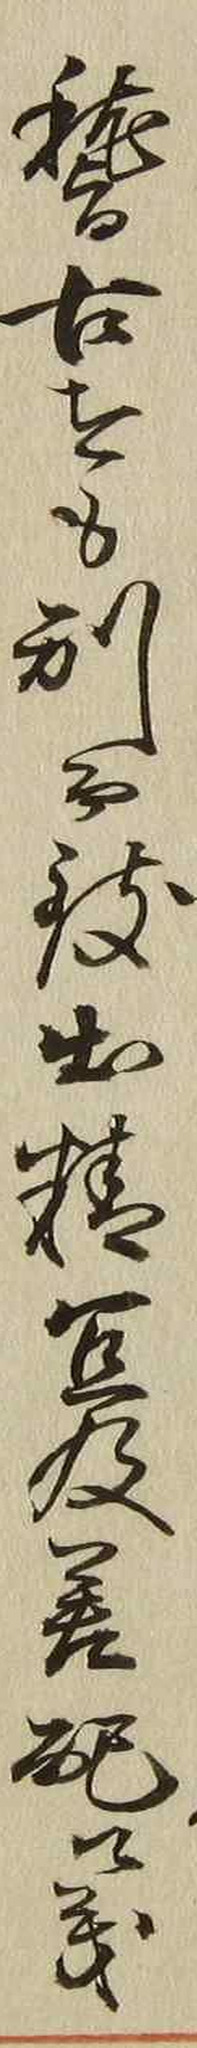稽古をも別而致出精宜及差配候義
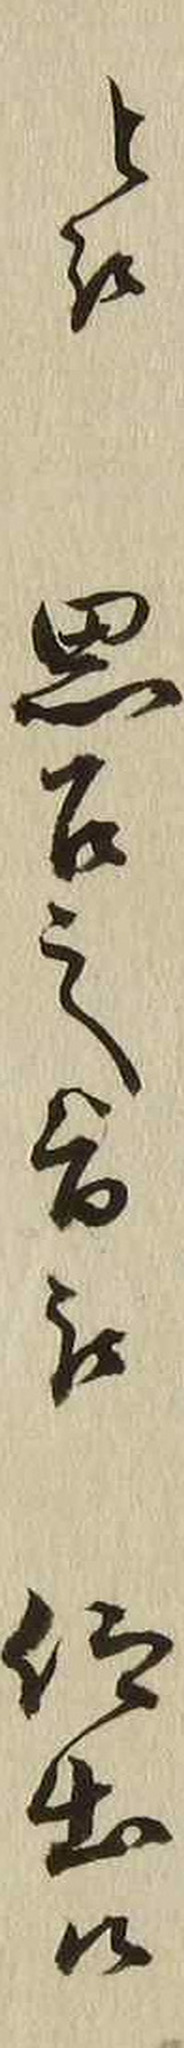と被思召之旨被仰出候
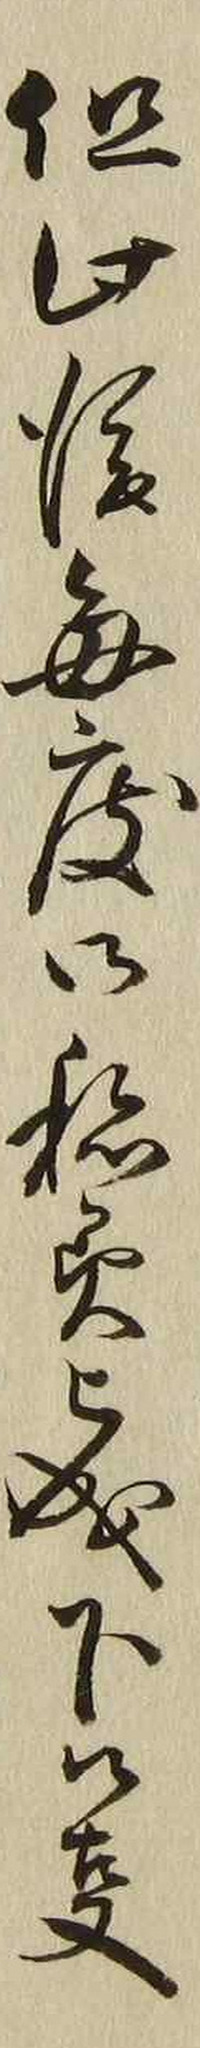但此後毎度御称美被成下候事
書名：諸士系譜　巻之60　と之部3
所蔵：会津若松市立会津図書館
